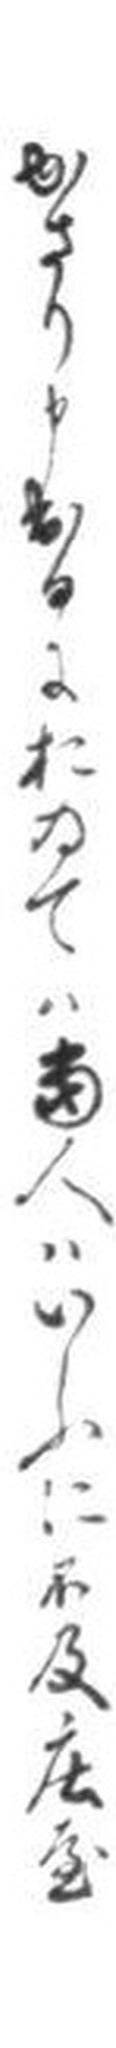かさり申出るにおいてハ当人ハいふに不及庄屋
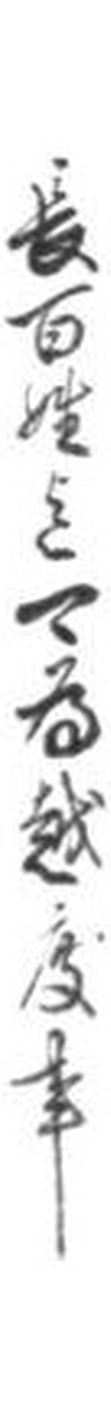長百姓迄可為越度事
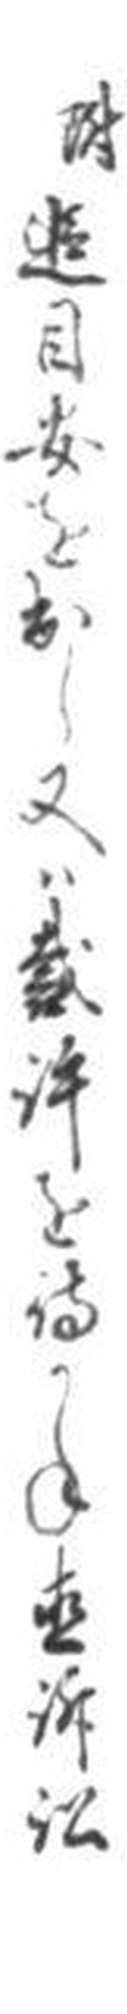追目安を出し又ハ裁許をまかて直訴訟
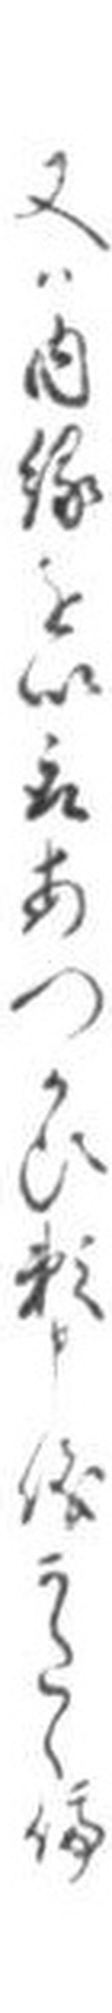又ハ内縁を以取あつかひ頼申儀かたく停
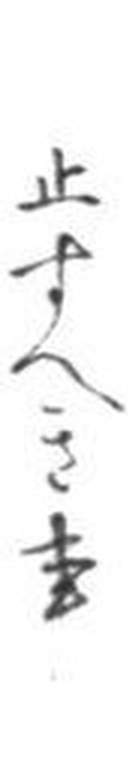止すへき事
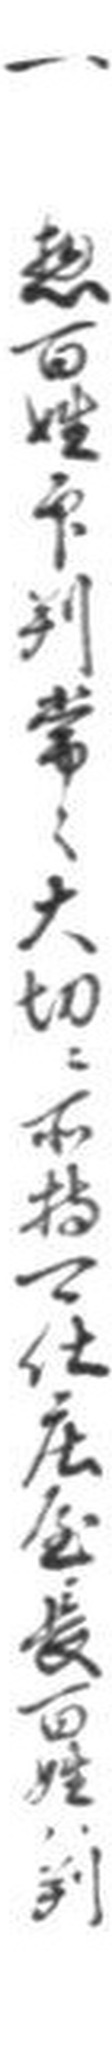一惣百姓印判常々大切ニ所持可仕庄屋長百姓ハ判
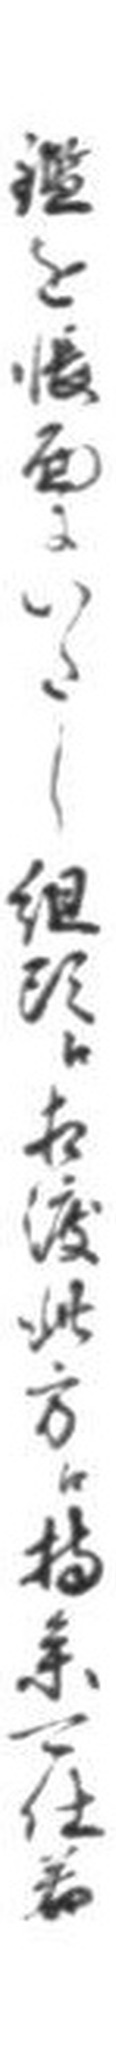鑑を帳面にいたし組頭江相渡此方江持参可仕若
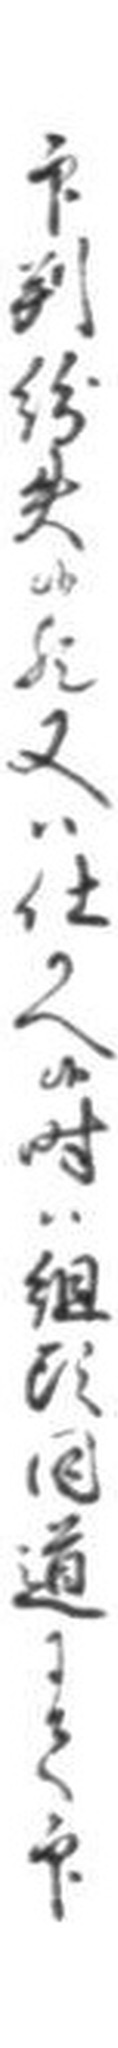印判紛失候歟又ハ仕かへｓ候時ハ組頭同道にて印
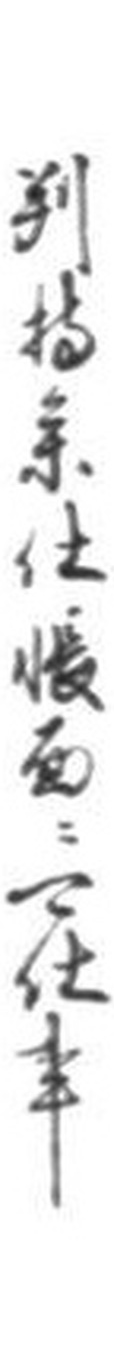判持参仕帳面ニ可仕事
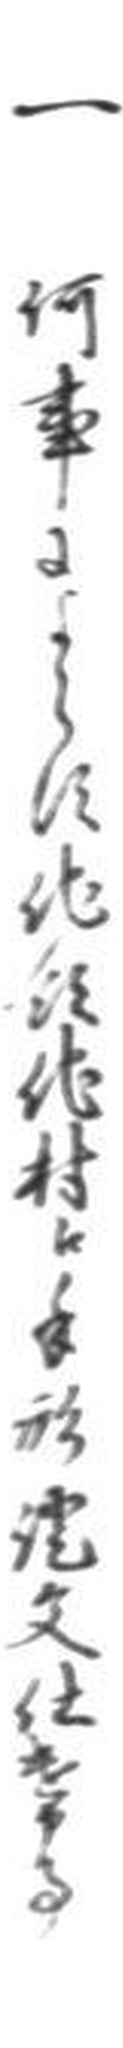一何事によらす他領他村江手形証文仕遣申事
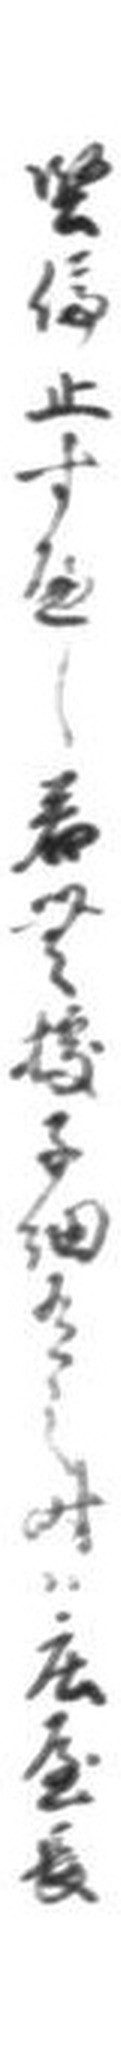堅停止すへし若無拠子細有之時ハ庄屋長
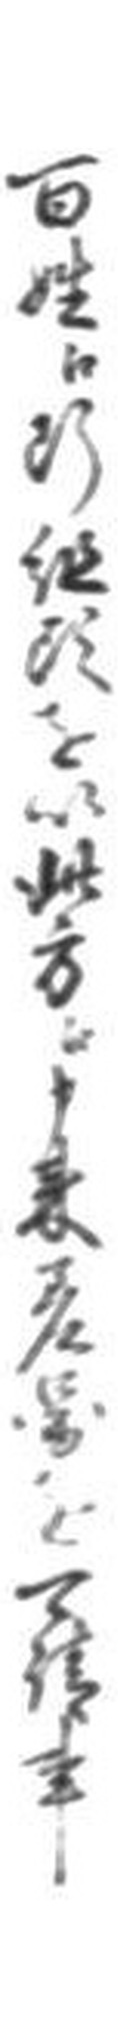百姓江断組頭を以此方江申来差図を可請事
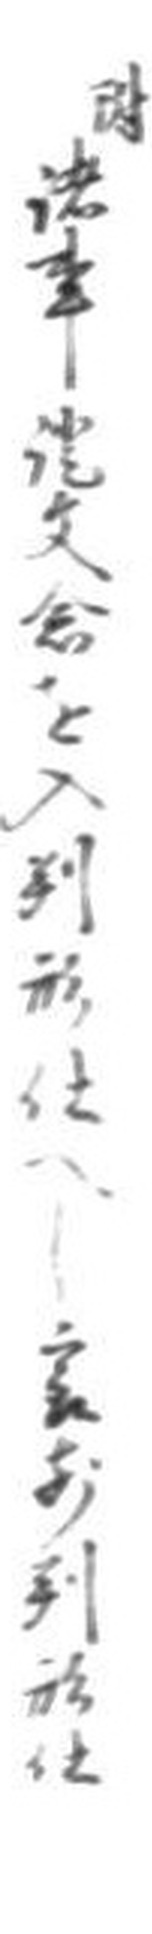諸事証文念を入判形仕へし最前判形仕
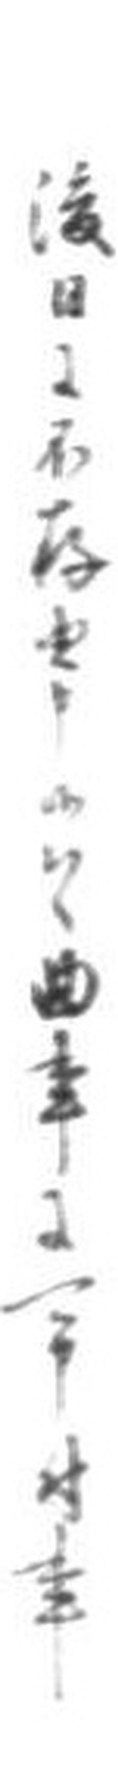後日に不存由申候ハヽ曲事に可申付事
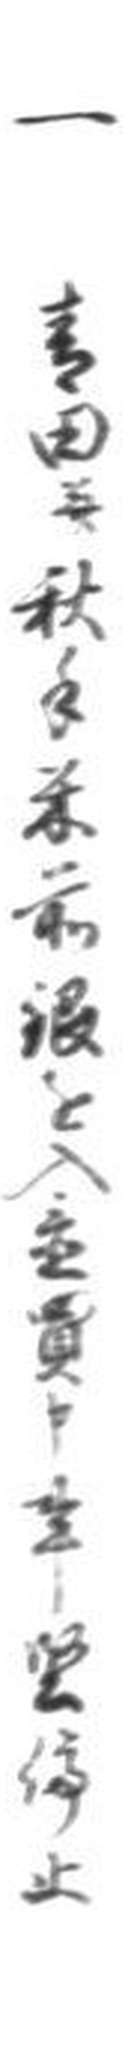一青田幷秋手米前銀を入置買申事堅停止
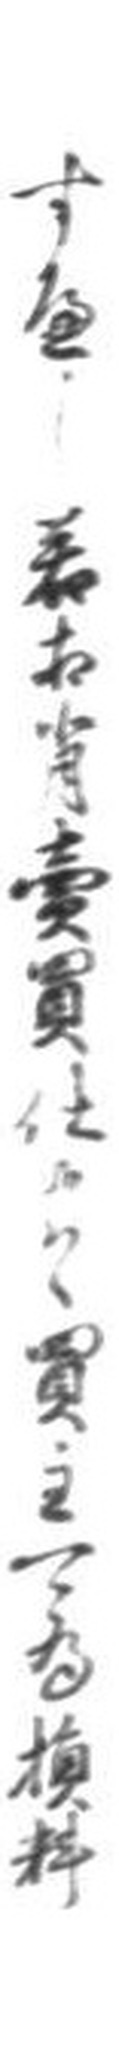すへし若相背売買仕候ハヽ買主可為損料
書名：家譜 三十四 吉邦公 従享保五年到同六年
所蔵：福井県文書館 Fukui Prefectural Archives
